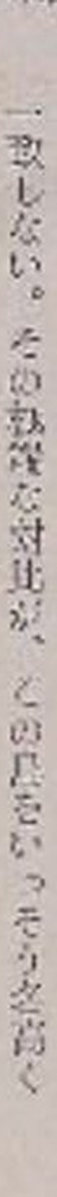一致しない。その極端な対比が、この島をいっそう名高く
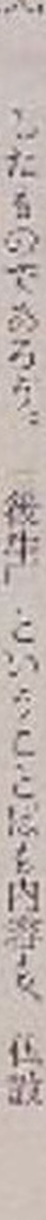したものであろう。「後生」ということばも内容も、仏教
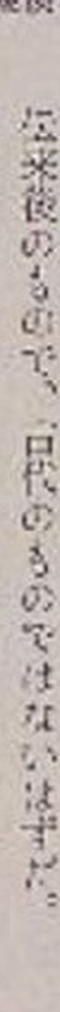伝来後のもので、古代ものもではないはずだ。
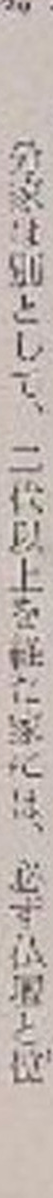分家は別として、二代以上を経た家には、必ず仏壇と位
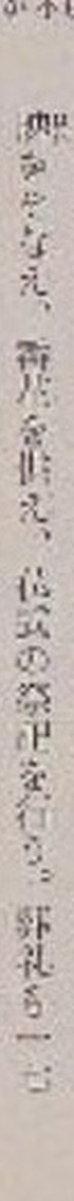牌をそなえ、香花を供え、仏式の祭祀を行う。葬礼も一七
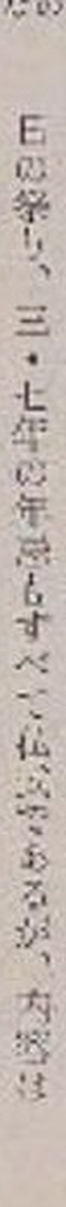日の祭り、三・七年の年忌もすべて仏式であるが、内容は
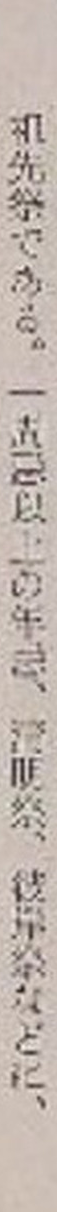祖先祭である。一周忌以上の年忌、清明祭、彼岸祭などに、
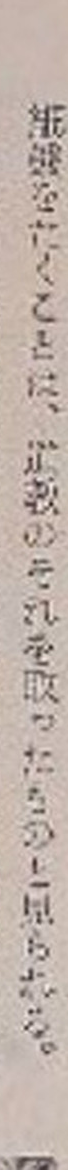紙銭をたくことは、道教のそれを取ったものと見られる。
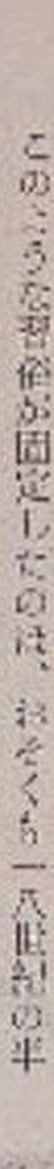このような習俗が固定したのは、おそくも一八世紀の半
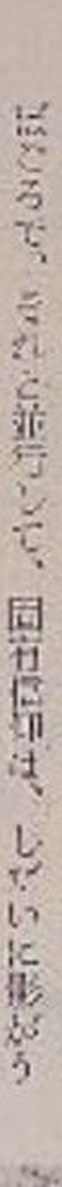ばごろで、それと並行して、固有信仰は、しだいに影がう
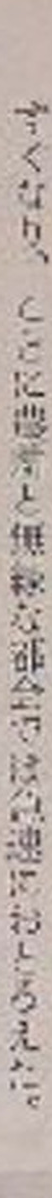すくなり、ことに農業と無縁な都会では急速におとろえた。
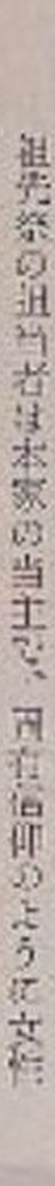祖先祭の担当者は本家の当主で、固有信仰のように女性
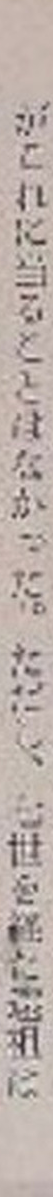がこれに当ることはなかった。ただし、七世を経た遠祖は
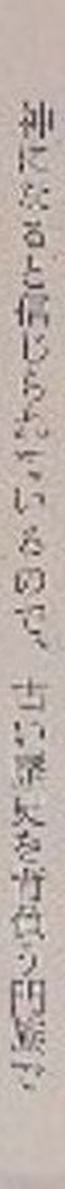神になると信じられているので、古い歴史を背負う門族で
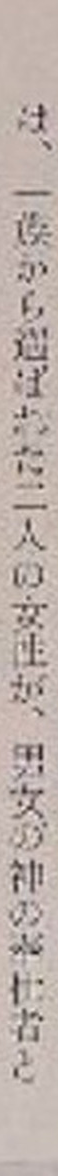は、一族から選ばれた二人の女性が、男女の神の奉仕者と
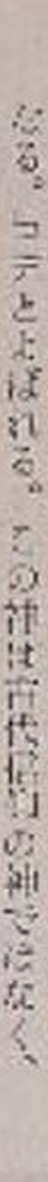なる。コデとよばれる。この神は古代信仰の神ではなく、
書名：沖縄固有信仰のおとろえ
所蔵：University of the Ryukyus Library
